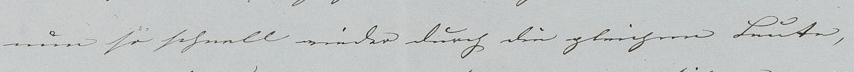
nun so schnell wieder durch die gleichen Leute,
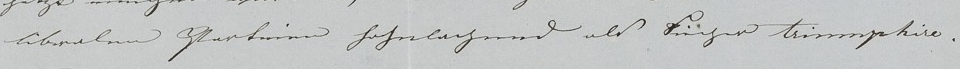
liberalen Parteien hohnlachend als Sieger triumphire.
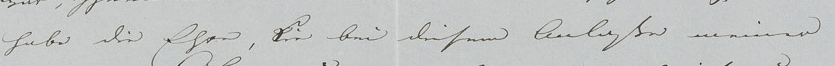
habe die Ehre, Sie bei diesem Anlaße meiner
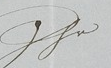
Ihr
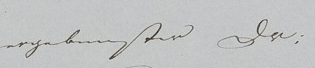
ergebenster Dr:
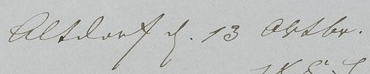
Altdorf d. 13 Oktbr.
